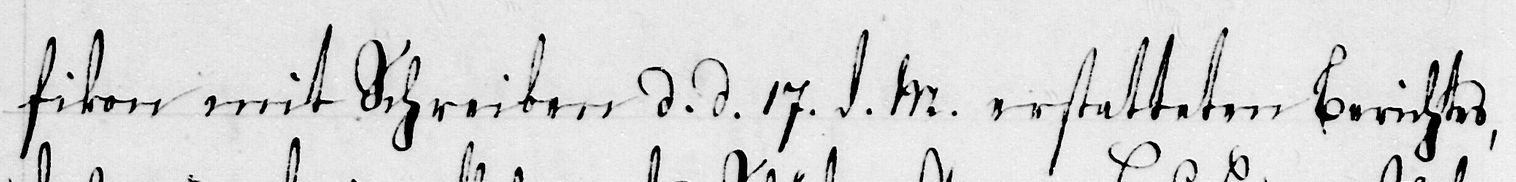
fikon mit Schreiben d. d. 17. d. M. erstatteten Berichtes,
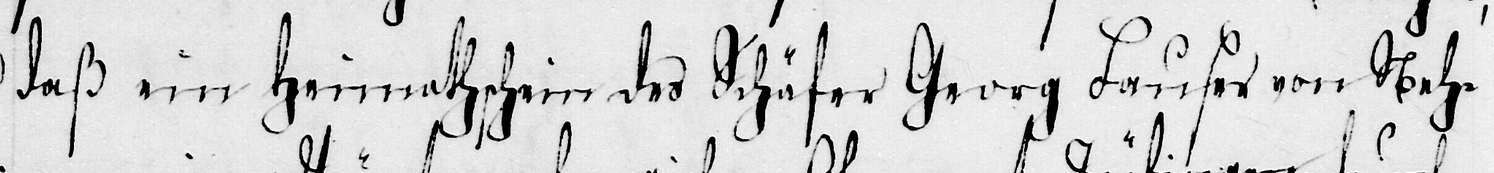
daß ein Heimathschein des Schäfer Georg Fauser von Neh¬
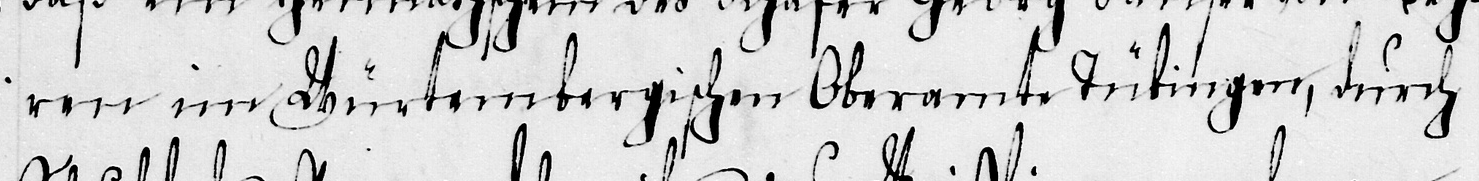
ren im Würtembergischen Oberamte Tübingen, durch
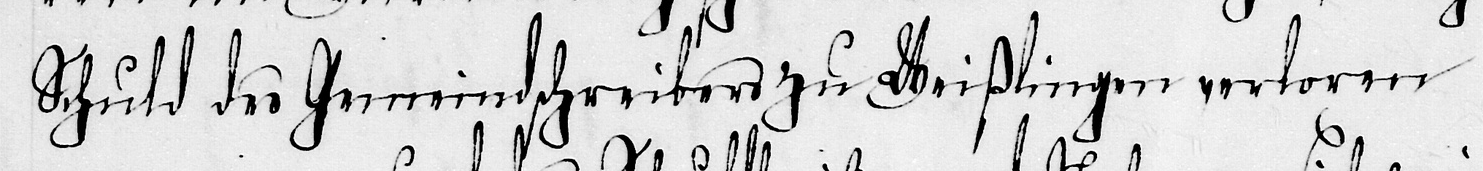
Schuld des Gemeindschreibers zu Weißlingen verloren
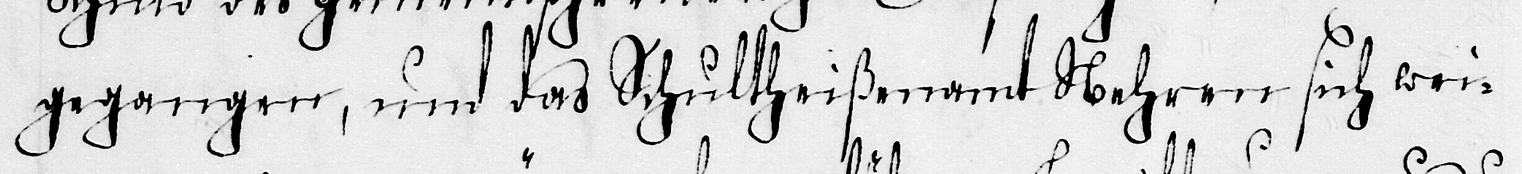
gegangen, und das Schultheißenamt Nehren sich wei¬
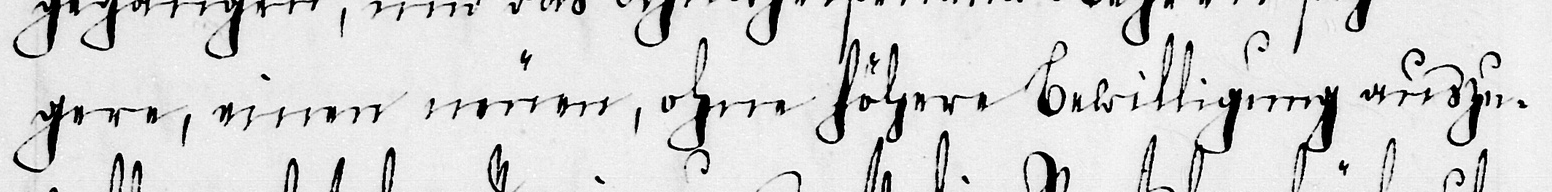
gere, einen neuen, ohne höhere Bewilligung auszu¬
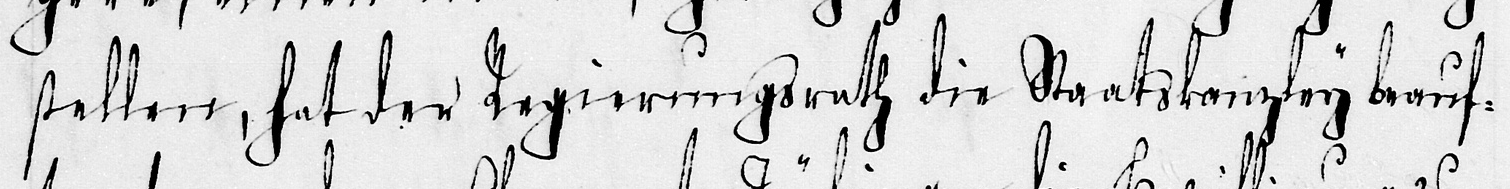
stellen, hat der Regierungsrath die Staatskanzley beauf¬
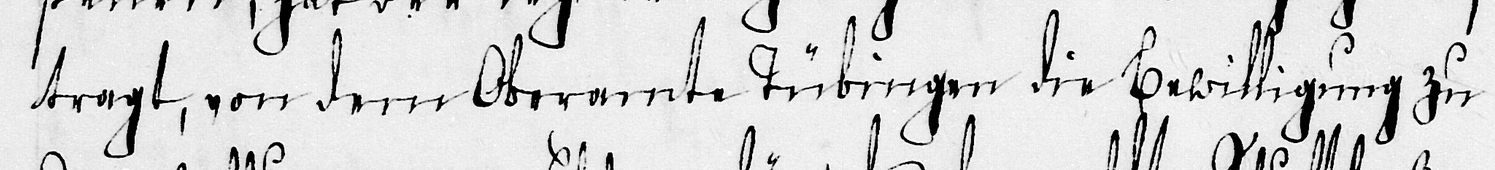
tragt, von dem Oberamte Tübingen die Bewilligung zu
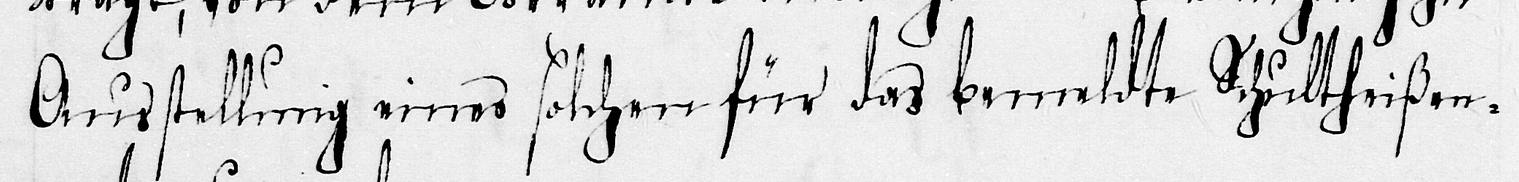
Ausstellung eines solchen für das bemeldte Schultheißen¬
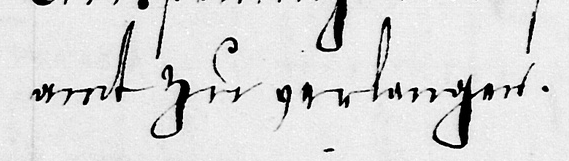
amt zu verlangen.
